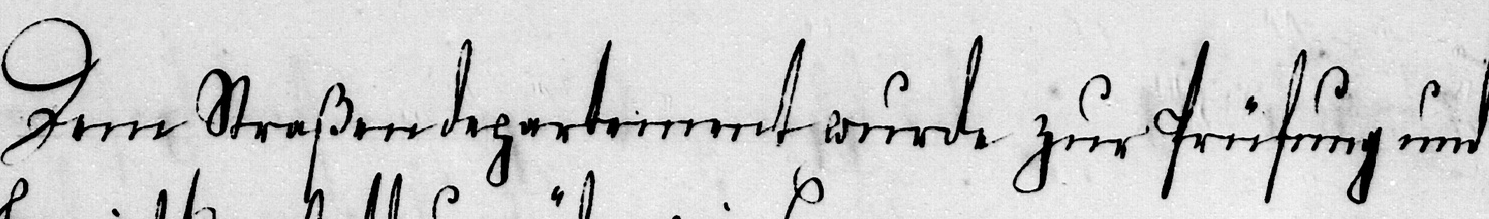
Dem Straßendepartement wurde zur Prüfung und
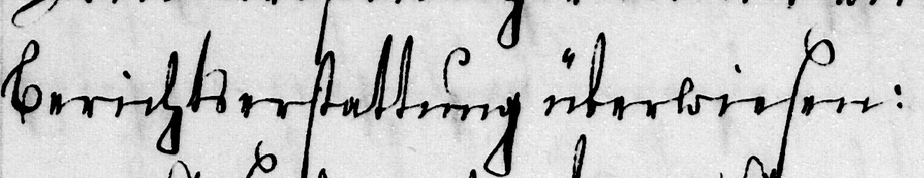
Berichtserstattung überwiesen:
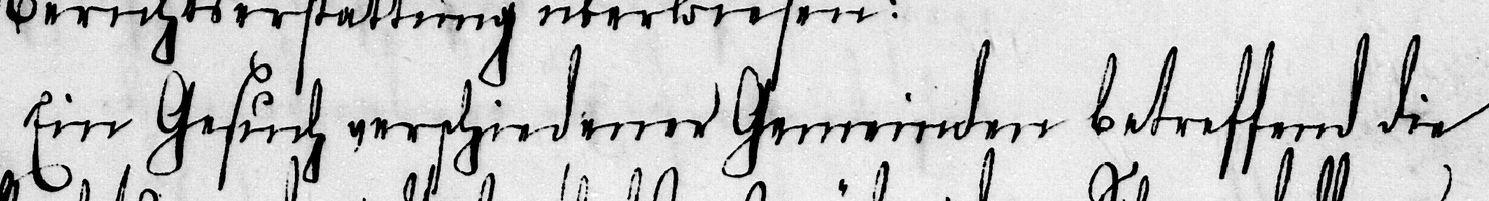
Ein Gesuch verschiedener Gemeinden betreffend die
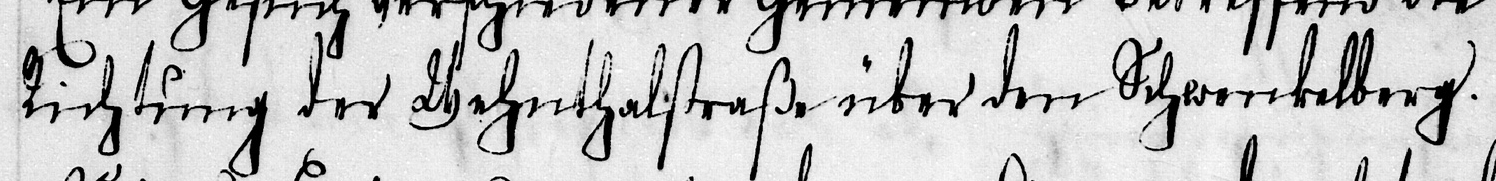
Richtung der Wehnthalstraße über den Schwenkelberg.
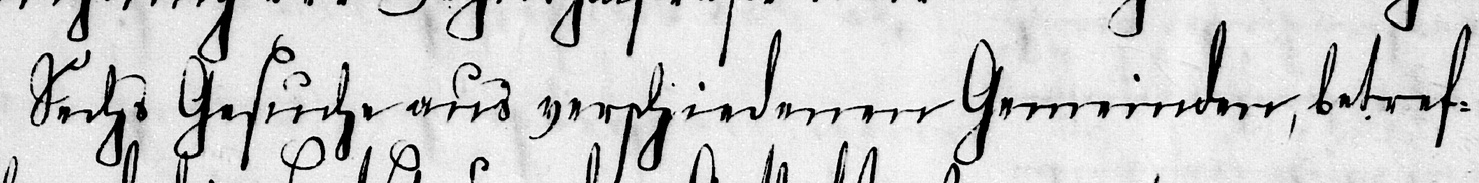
Sechs Gesuche aus verschiedenen Gemeinden, betref¬
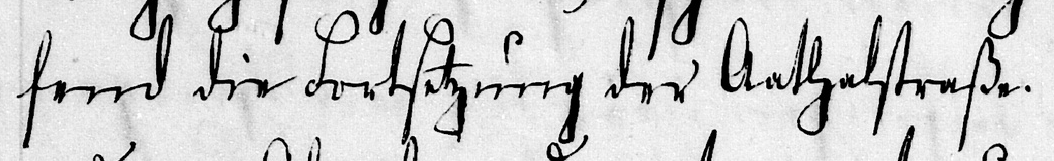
fend die Fortsetzung der Aathalstraße.
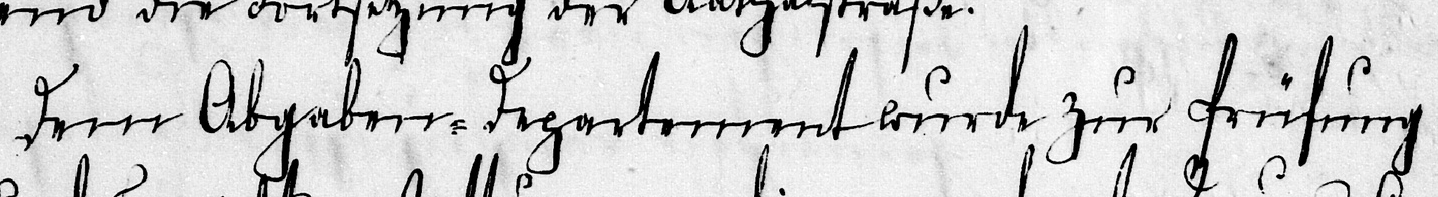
Dem Abgaben-Departement wurde zur Prüfung
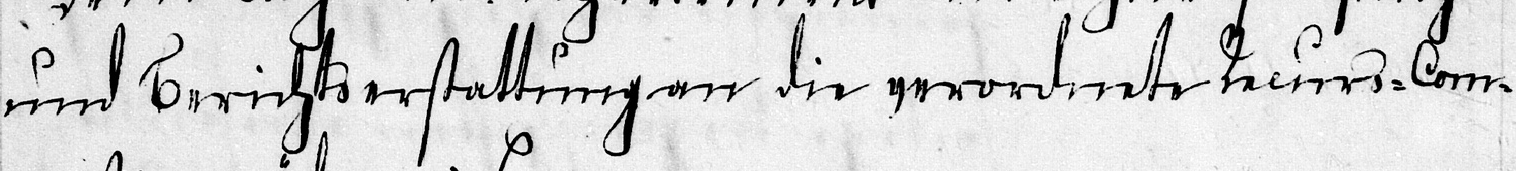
und Berichtserstattung an die verordnete Recurs-Com¬
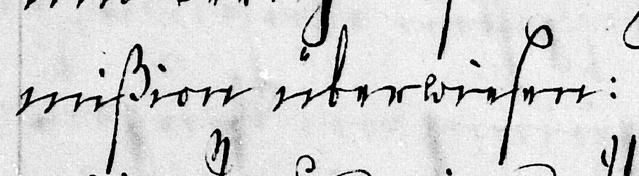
mißion überwiesen:
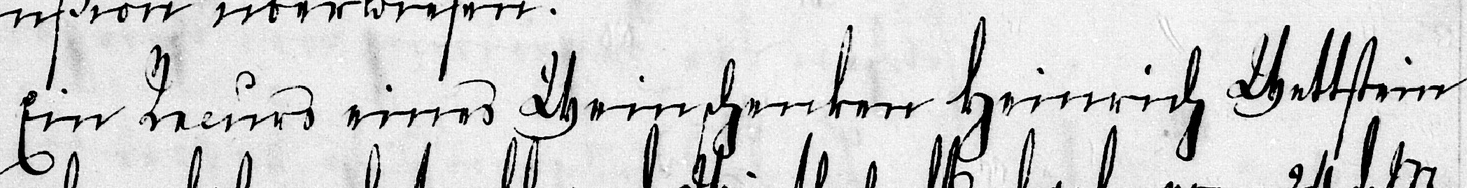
Ein Recurs eines Weinschenken Heinrich Wettstein
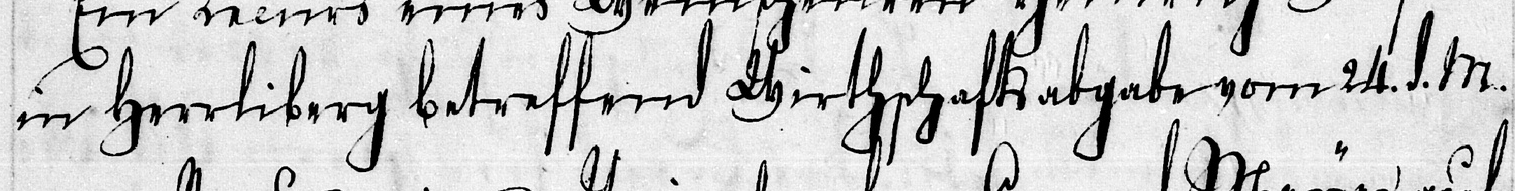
in Herrliberg betreffend Wirthschaftsabgabe vom 24. d. M.
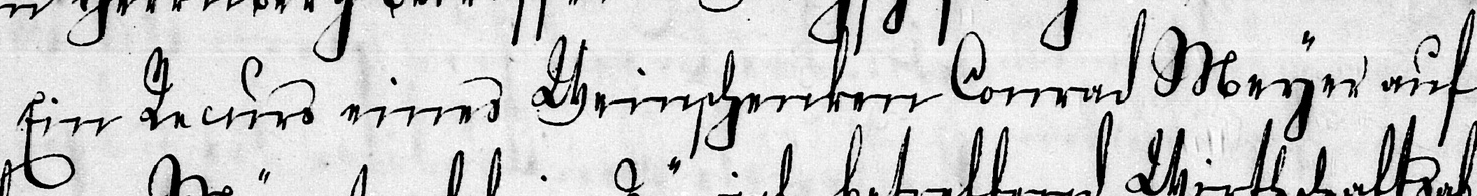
Ein Recurs eines Weinschenken Conrad Meyer auf
